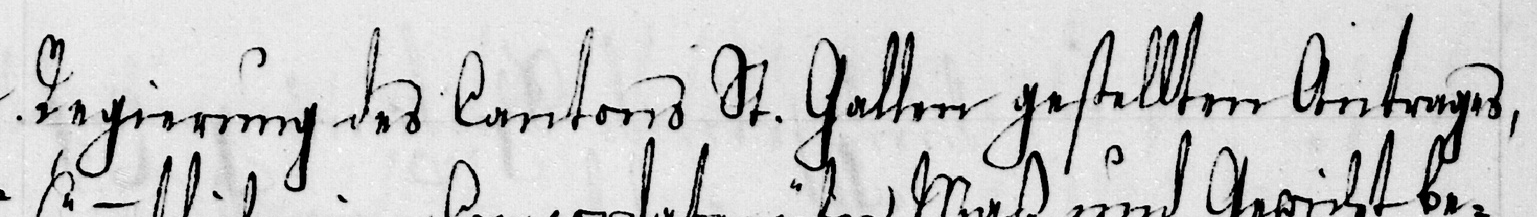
Regierung des Cantons St. Gallen gestellten Antrages,
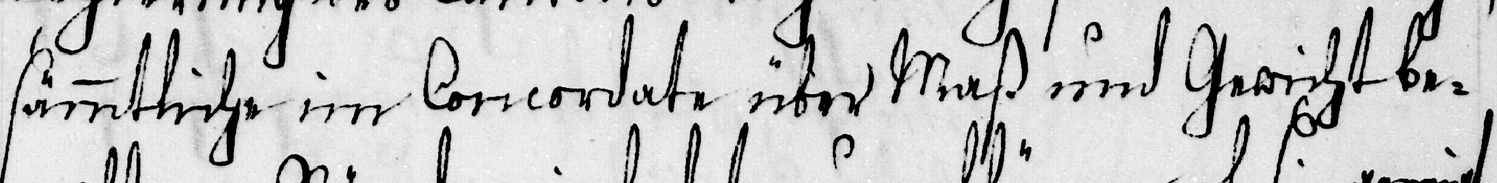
sämmtliche im Concordate über Maß und Gewicht be¬
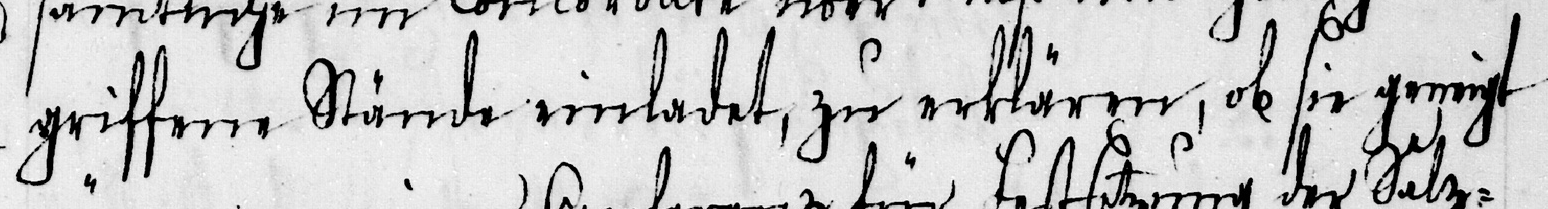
griffene Stände einladet, zu erklären, ob sie geneigt
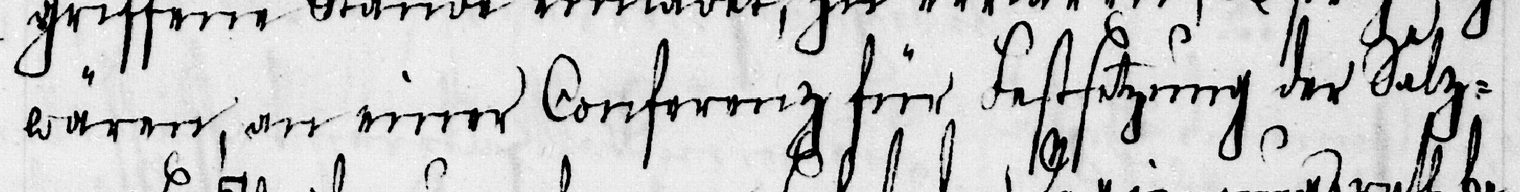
wären, an einer Conferenz für Festsetzung der Salz¬
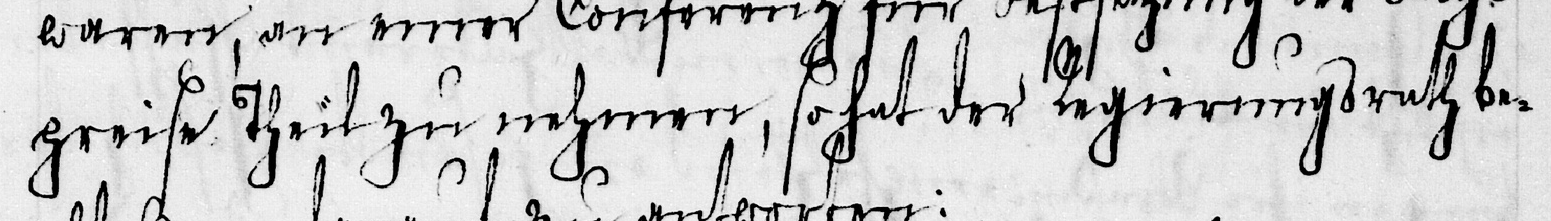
preise Theil zu nehmen, so hat der Regierungsrath be¬
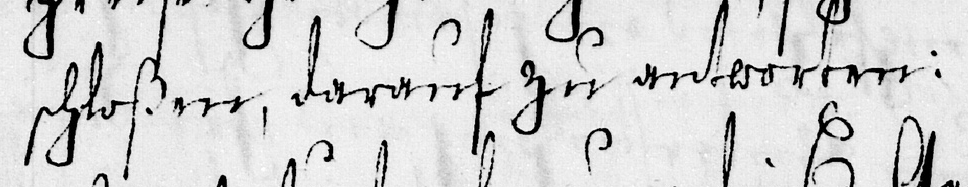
schloßen, darauf zu antworten:
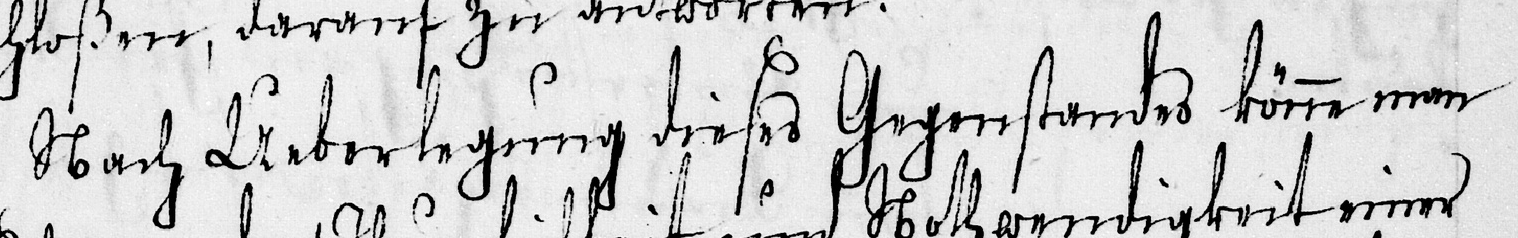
Nach Ueberlegung dieses Gegenstandes könne man
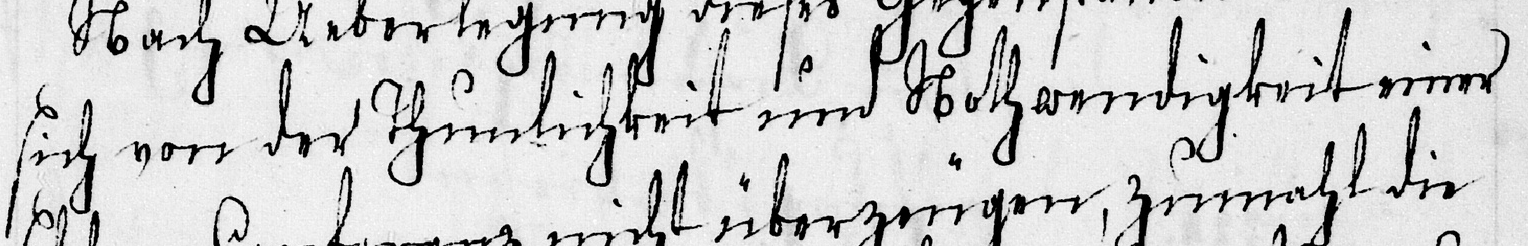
sich von der Thunlichkeit und Nothwendigkeit einer
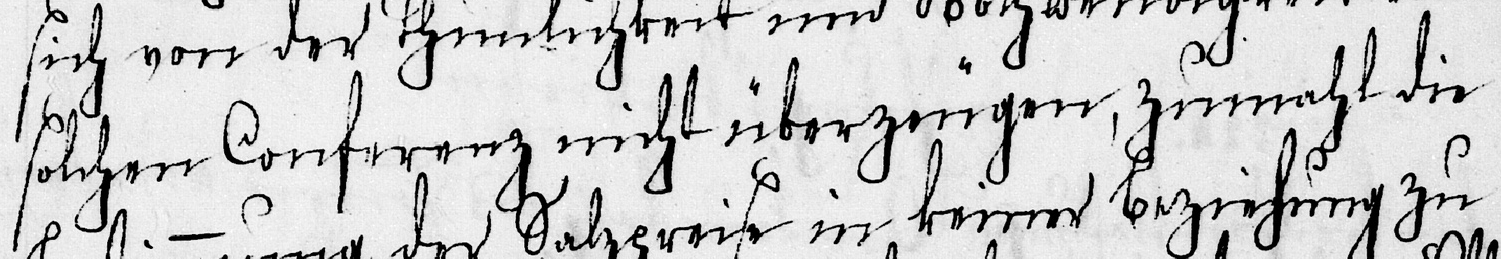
solchen Conferenz nicht überzeugen, zumahl die
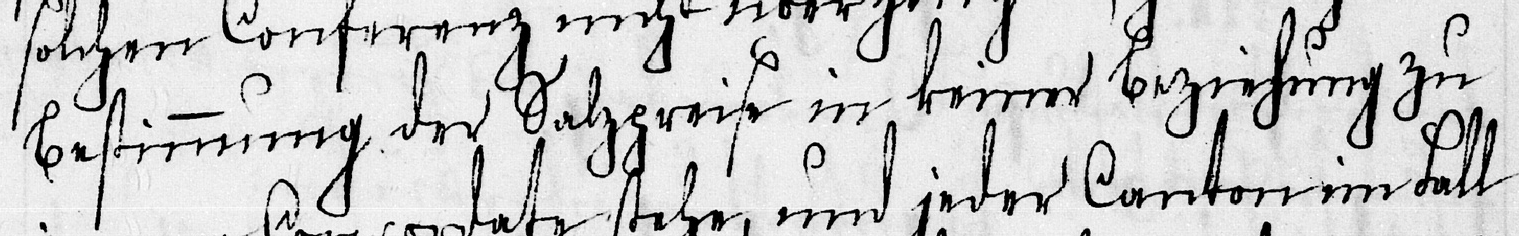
Bestimmung der Salzpreise in keiner Beziehung zu
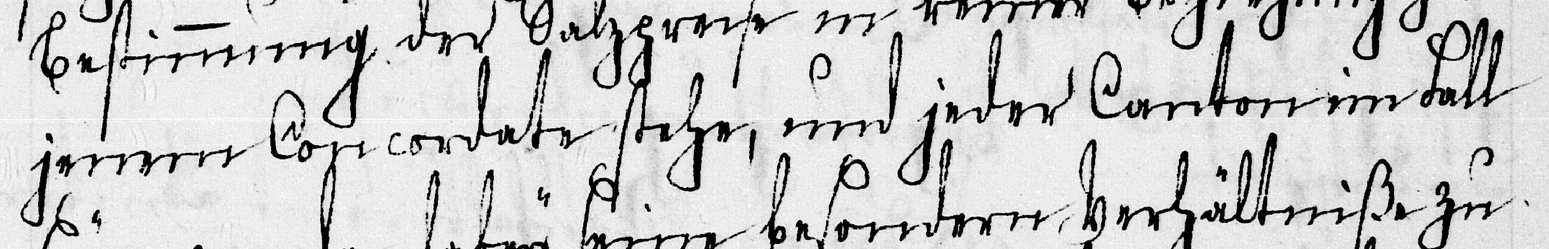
jenem Concordate stehe, und jeder Canton im Fall
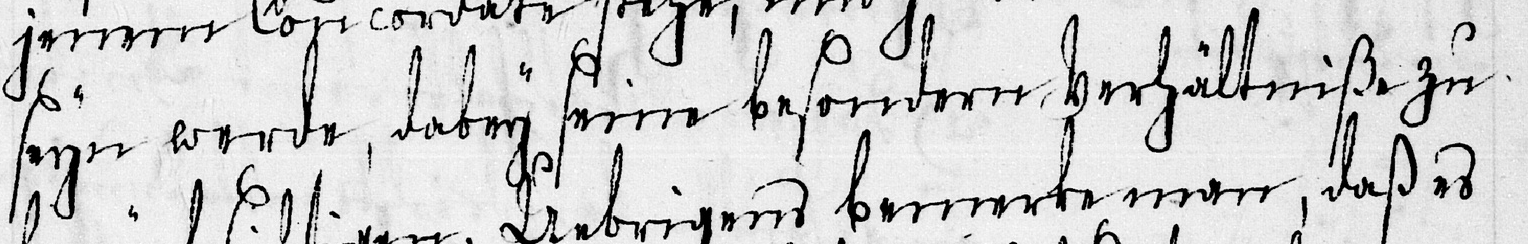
seyn werde, dabey seine besondern Verhältniße zu
